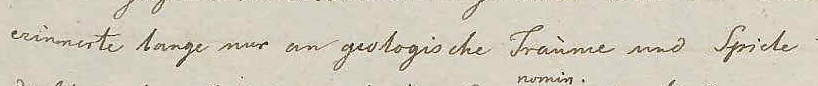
erinnerte lange nur an geologische Träume und Spiele
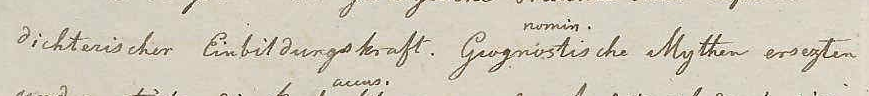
dichterischer Einbildungskraft. Geognostische nomin. Mythen ersezten
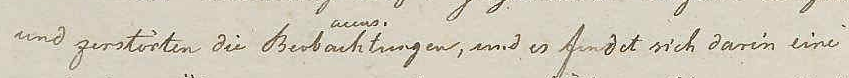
und zerstörten die Beobachtungen accus., und es findet sich darin eine
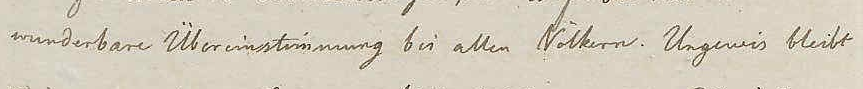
wunderbare Übereinstimmung bei allen Völkern. Ungewis bleibt
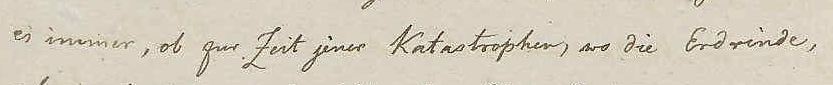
es immer, ob zur Zeit jener Katastrophen, wo die Erdrinde,
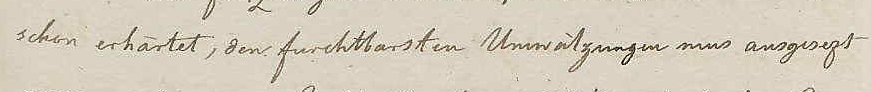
schon erhärtet, den furchtbarsten Umwälzungen mus ausgesezt
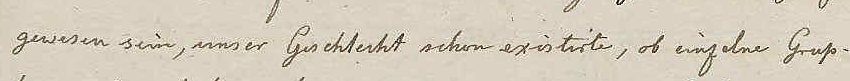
gewesen sein, unser Geschlecht schon existirte, ob einzelne Grup-
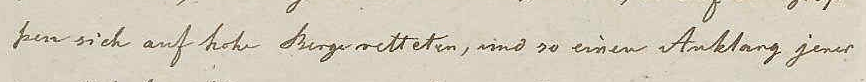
pen sich auf hohe Berge retteten, und so einen Anklang jener
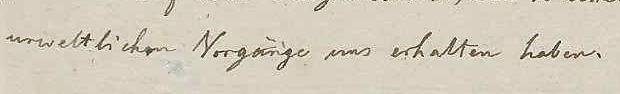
urweltlichen Vorgänge uns erhalten haben.
